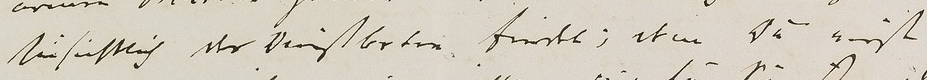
hinsichtlich der Dienstboten findet; eben Du wirst
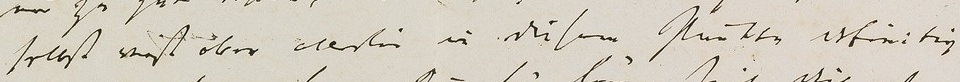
selbst wirst aber allerlei in diesem Punkte definitiv
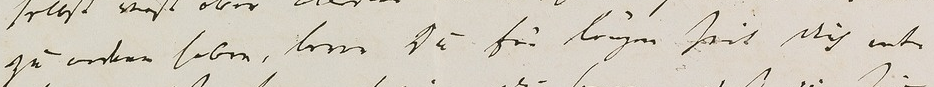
zu ordnen haben, bevor Du für längere Zeit dich ent-
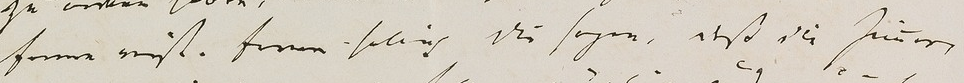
fernen wirst. Ferner soll ich dir sagen, daß die Zimmer,
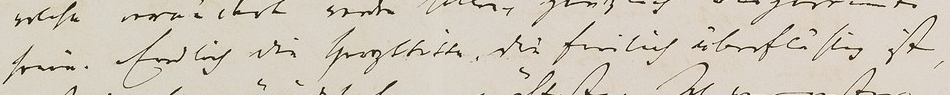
seien. Endlich die Hauptbitte, die freilich überflüssig, ist,
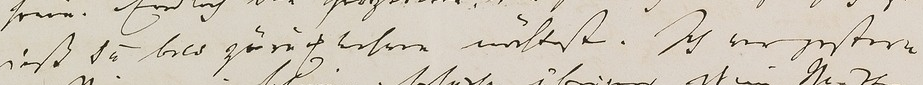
daß Du bald zurückkehren möchtest. Ich war gestern
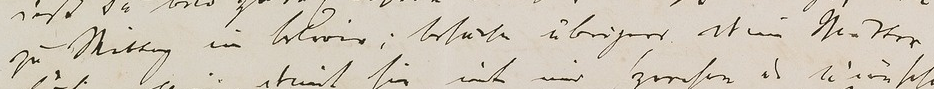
zu Mittag im Belvoir; besuche übrigens deine Mutter
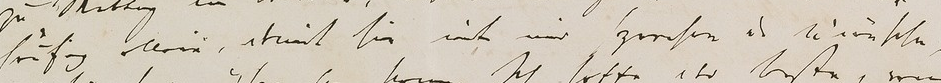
häufig allein, damit sie mit mir sprechen u. Wünsche,
